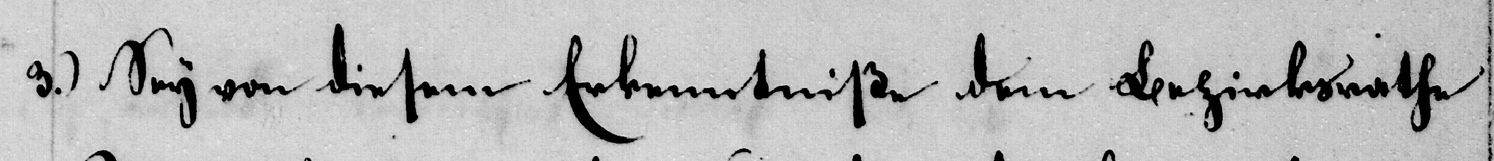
3.) Sey von diesem Erkenntniße dem Bezirksrathe
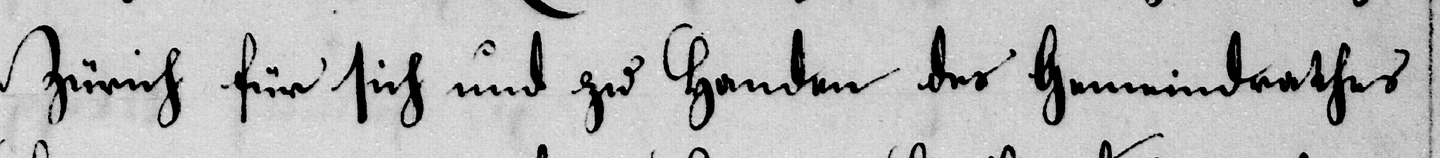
Zürich für sich und zu Handen des Gemeindrathes
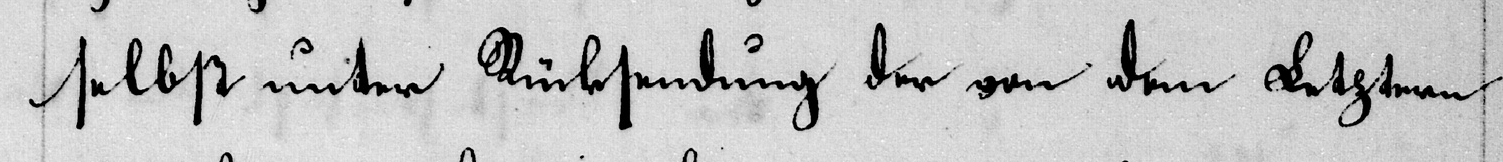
selbst unter Rücksendung der von dem Letztern
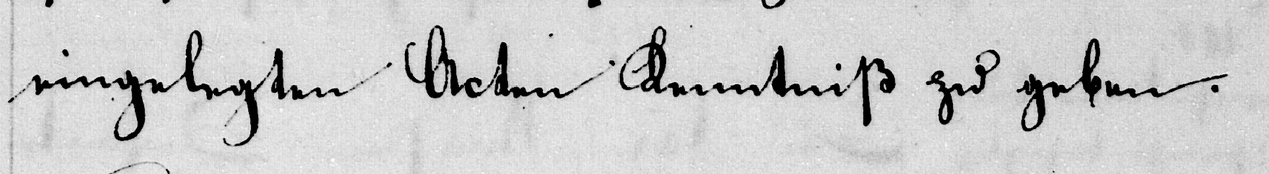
eingelegten Acten Kenntniß zu geben.
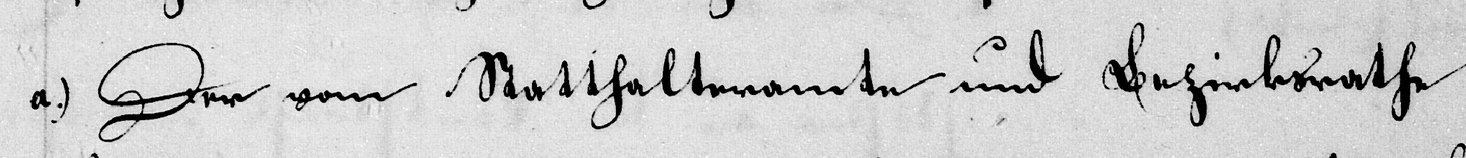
a.) Der vom Statthalteramte und Bezirksrathe
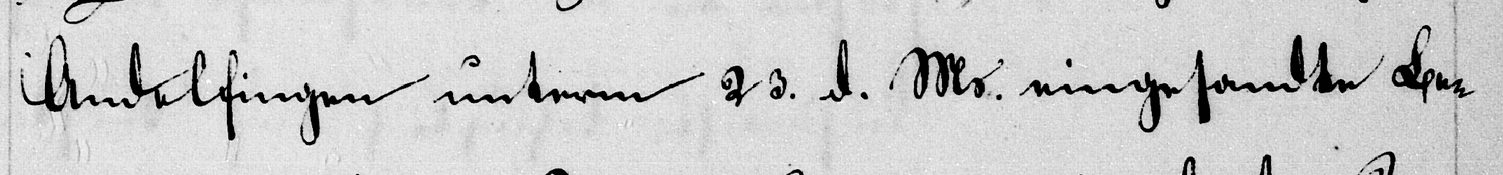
Andelfingen unterm 23. d. Ms. eingesandte Be¬
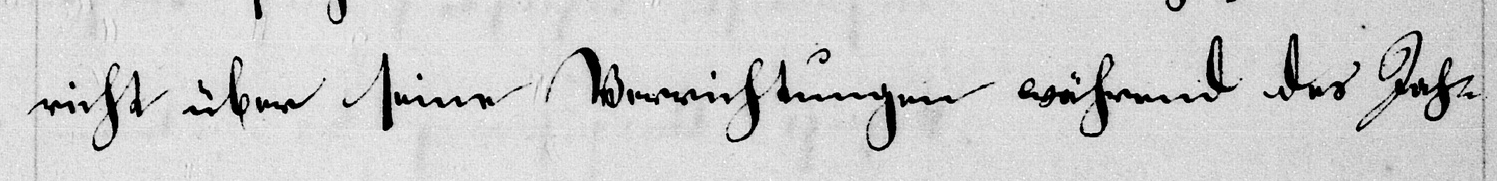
richt über seine Verrichtungen während des Jah¬
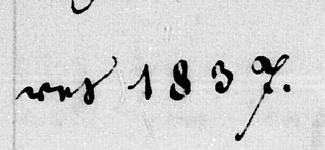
res 1837.
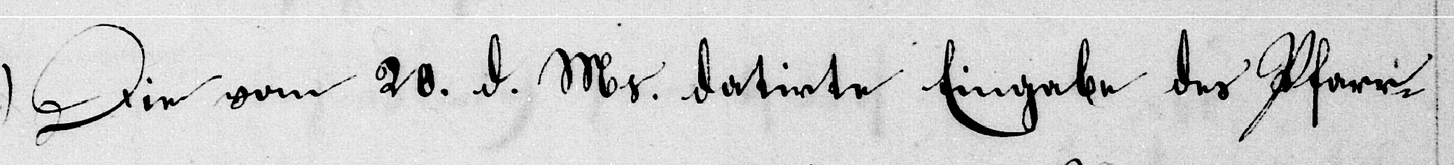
Die vom 20. d. Ms. datirte Eingabe des Pfarr¬
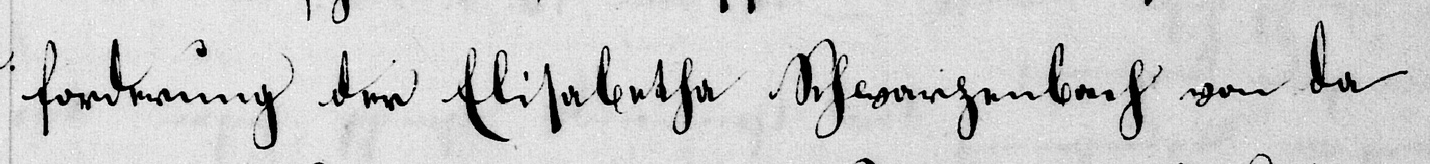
forderung der Elisabetha Schwarzenbach von da
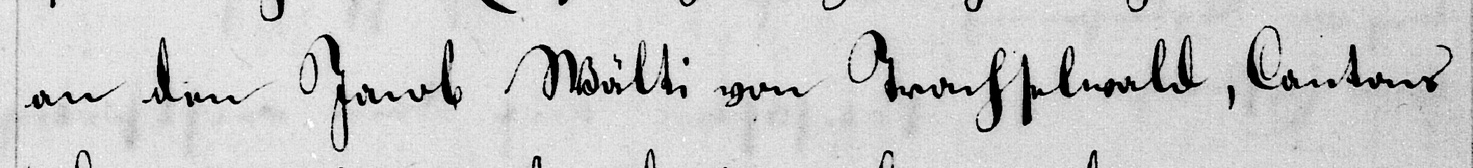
an den Jacob Wälti von Trachselwald, Cantons
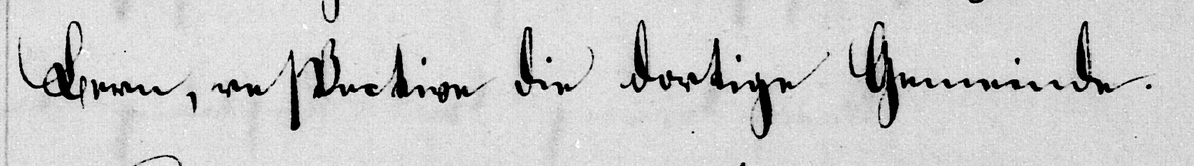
Bern, respective die dortige Gemeinde.
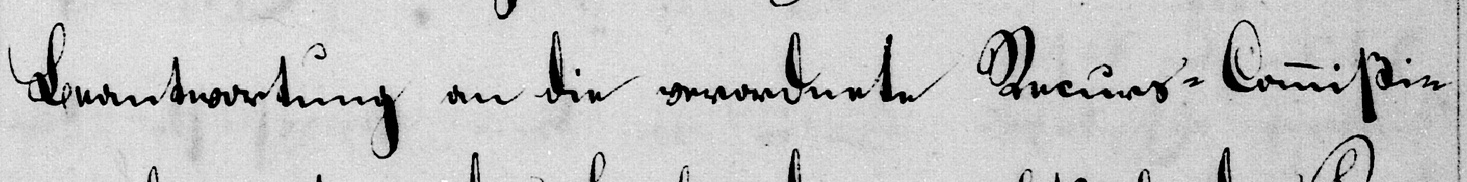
Beantwortung an die verordnete Recurs-Commißio¬
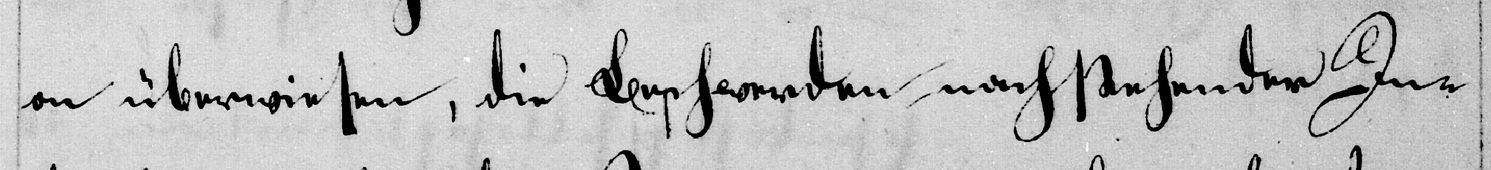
n überwiesen, die Beschwerden nachstehender In¬
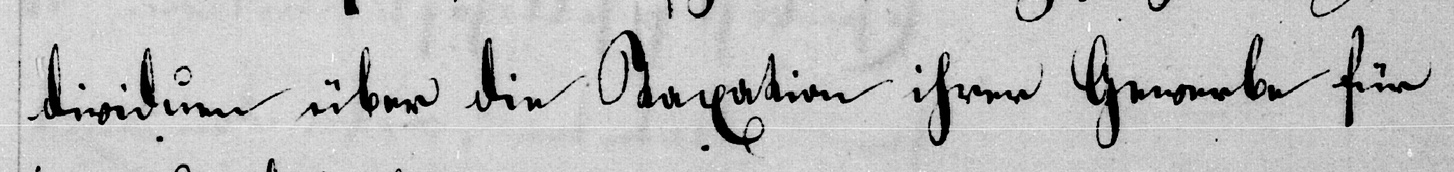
dividuen über die Taxation ihrer Gewerbe für
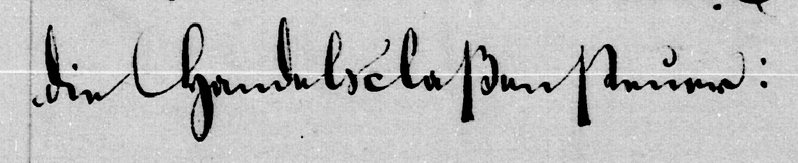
die Handelsclaßensteuer:
